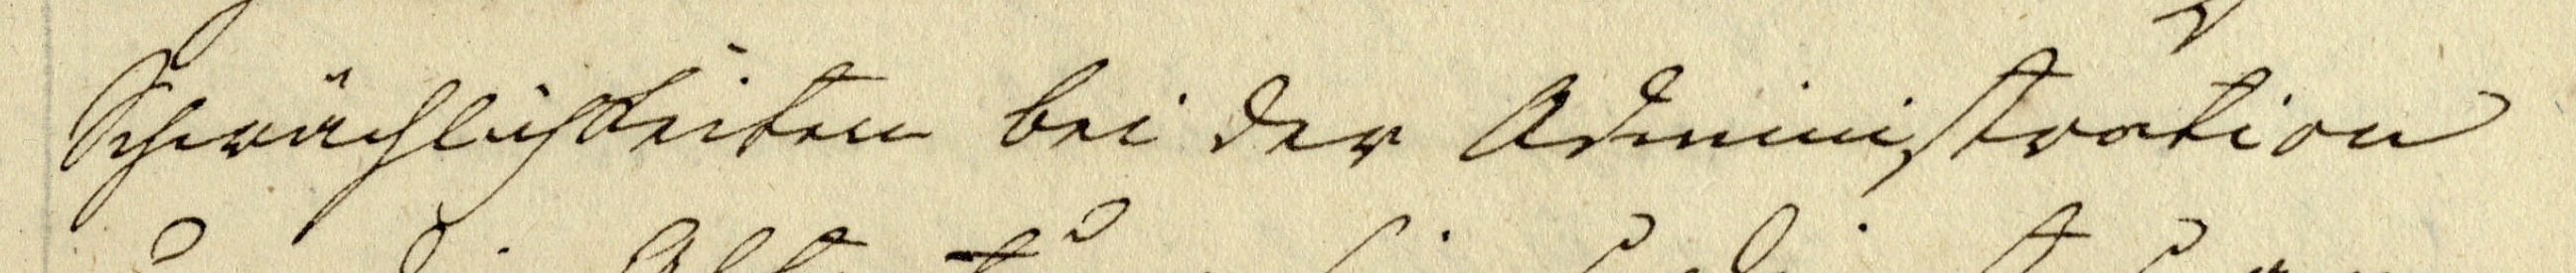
Schwächlichkeiten bei der Administration
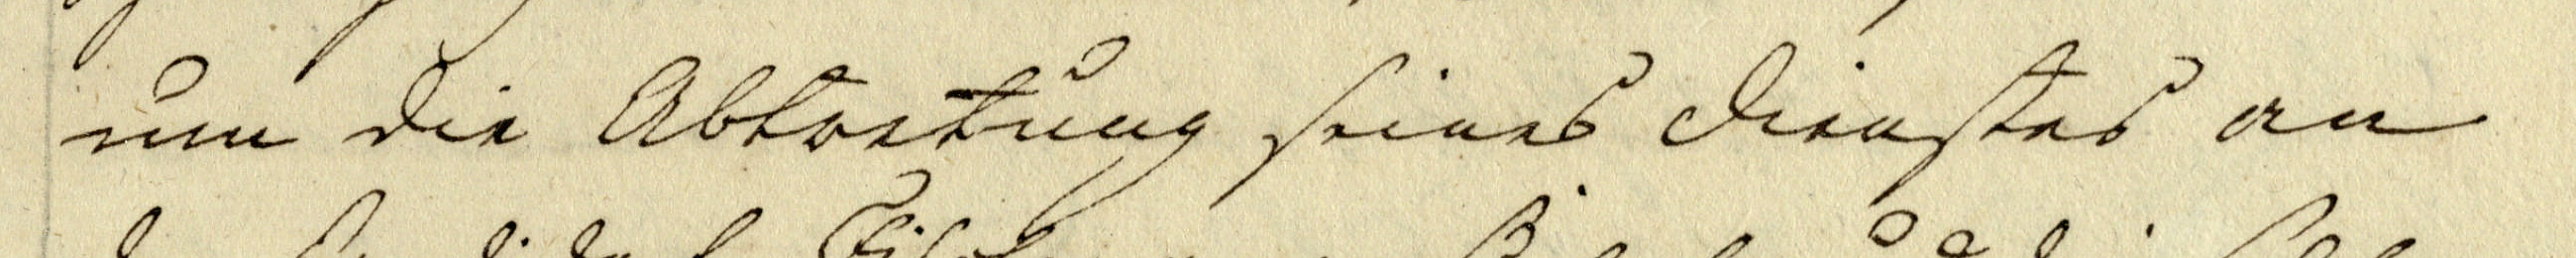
um die Abtretung seines Dienstes an
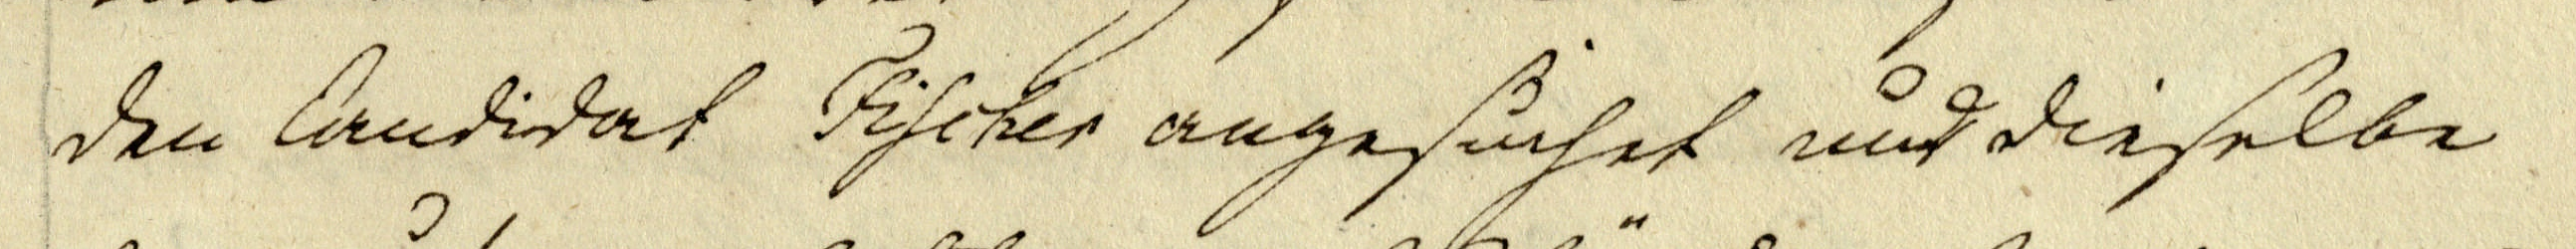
den Candidat Fischer angesuchet und dieselbe
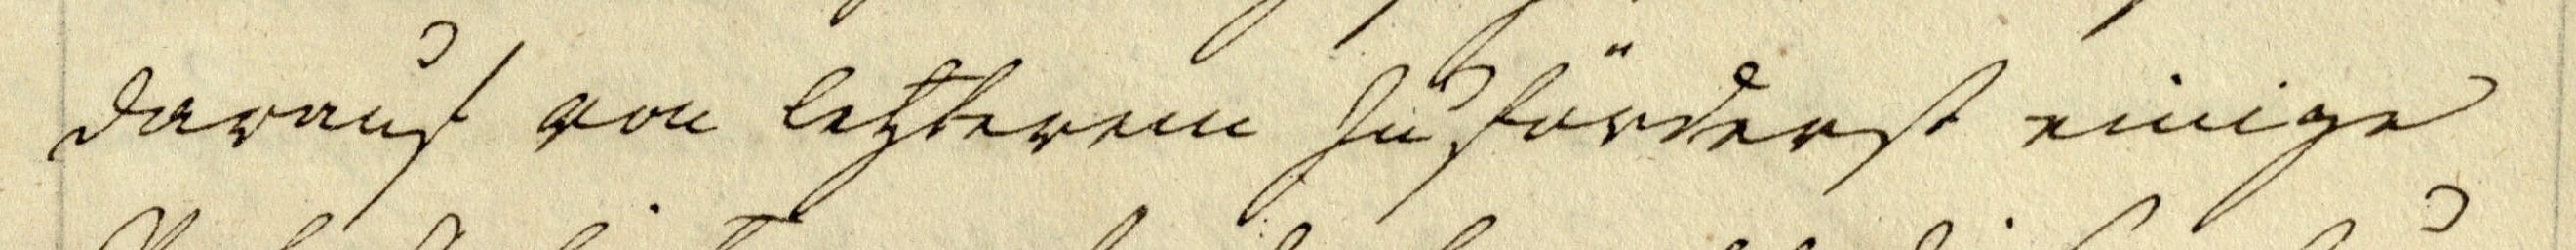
darauf von letzterem zuförderst einige
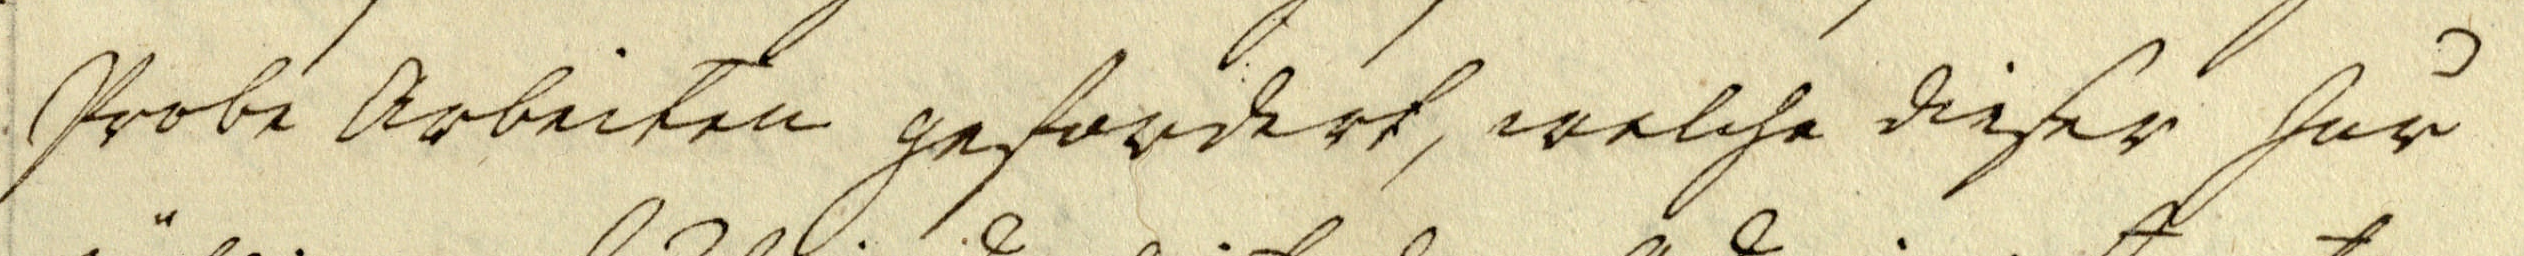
Probe Arbeiten gefordert, welche dieser zur
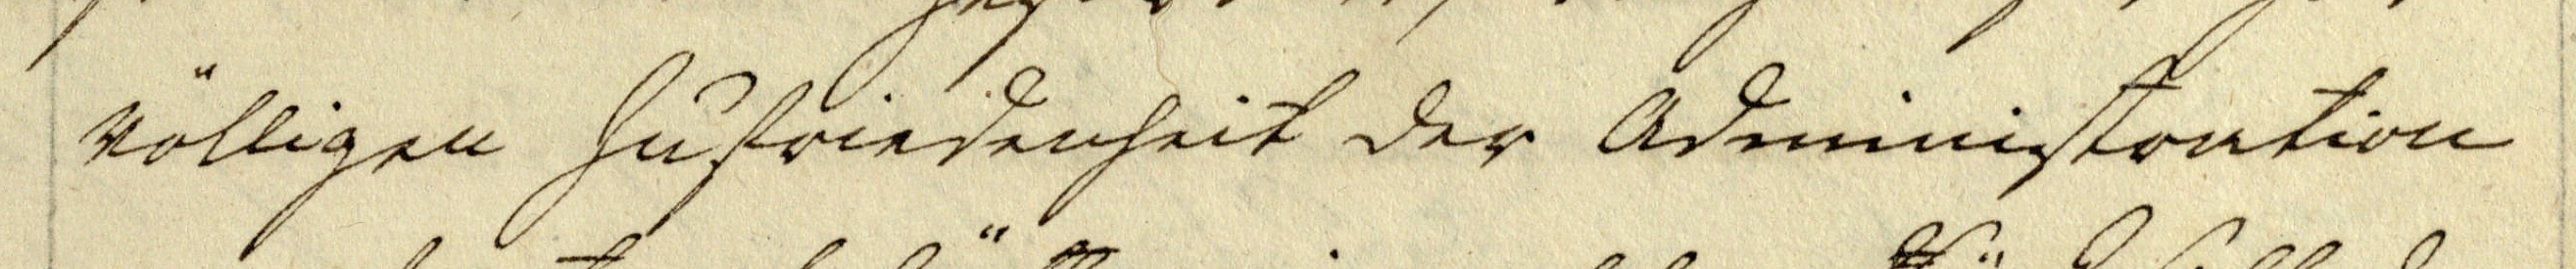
völligen Zufriedenheit der Administration
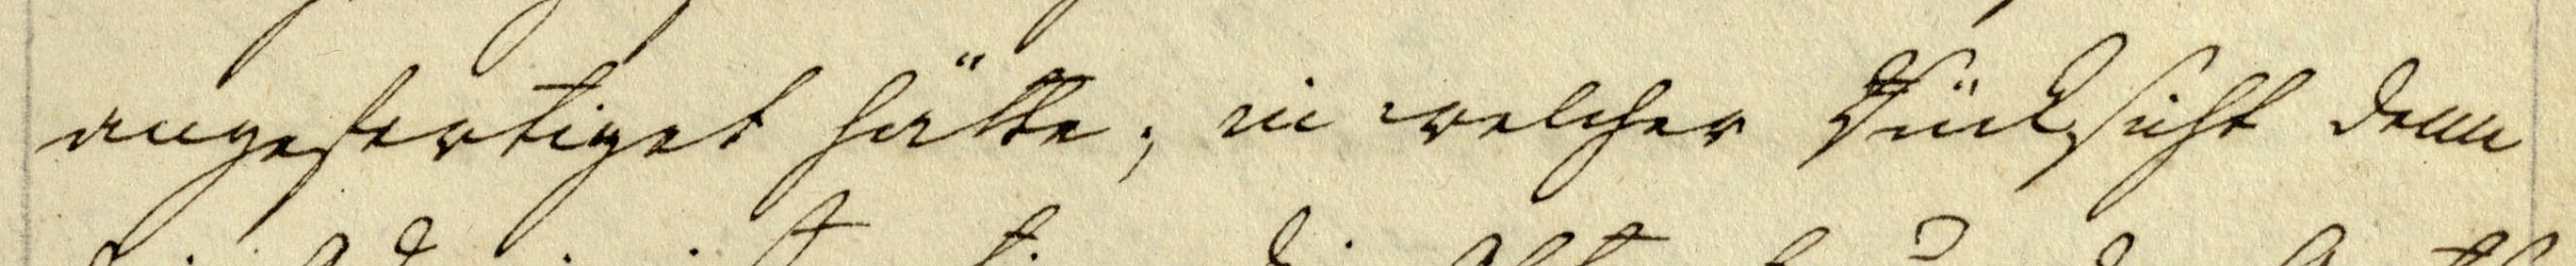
angefertiget hätte; in welcher Rücksicht denn
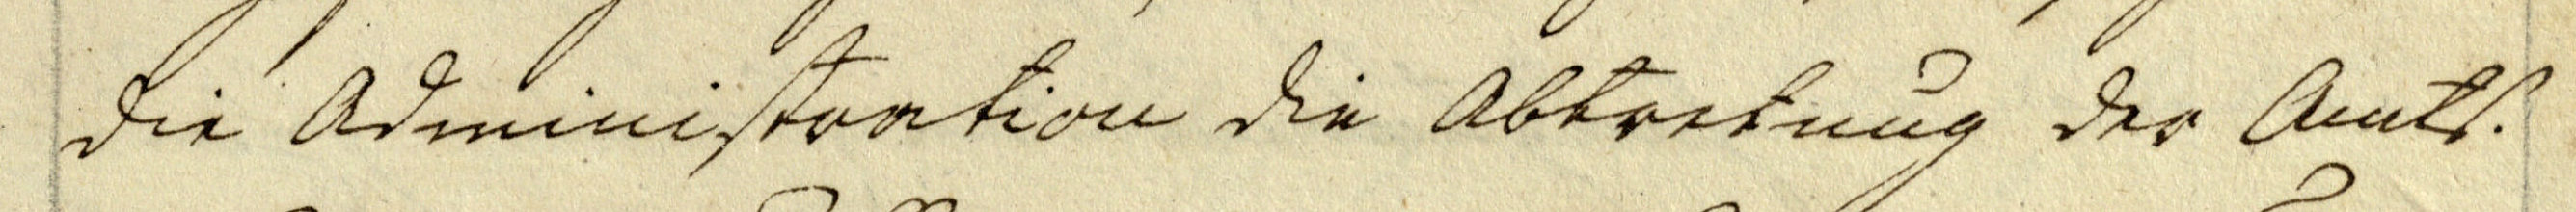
die Administration die Abtretung der Amts¬
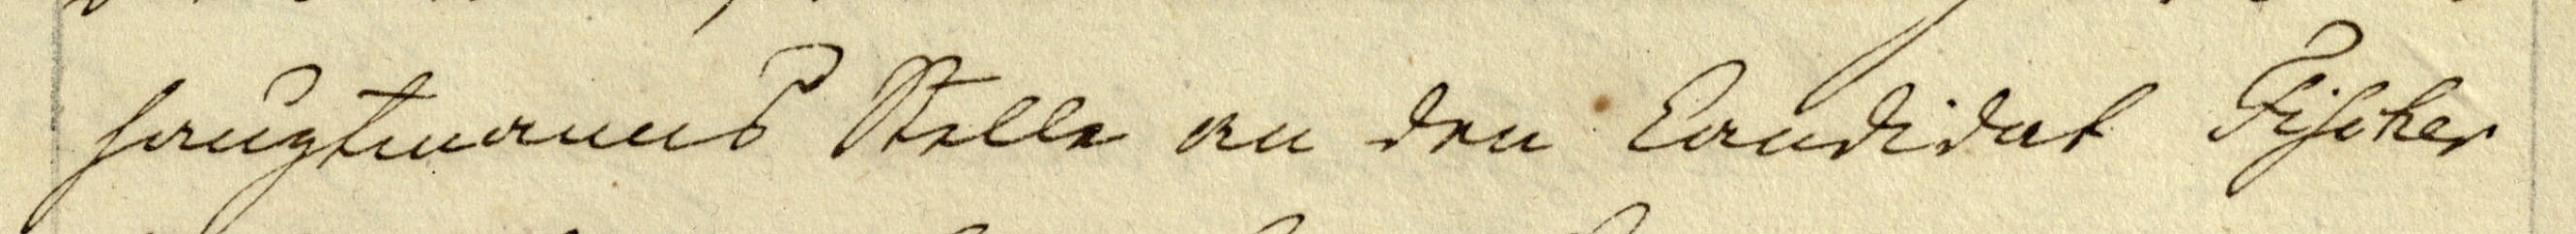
hauptmanns Stelle an den Candidat Fischer
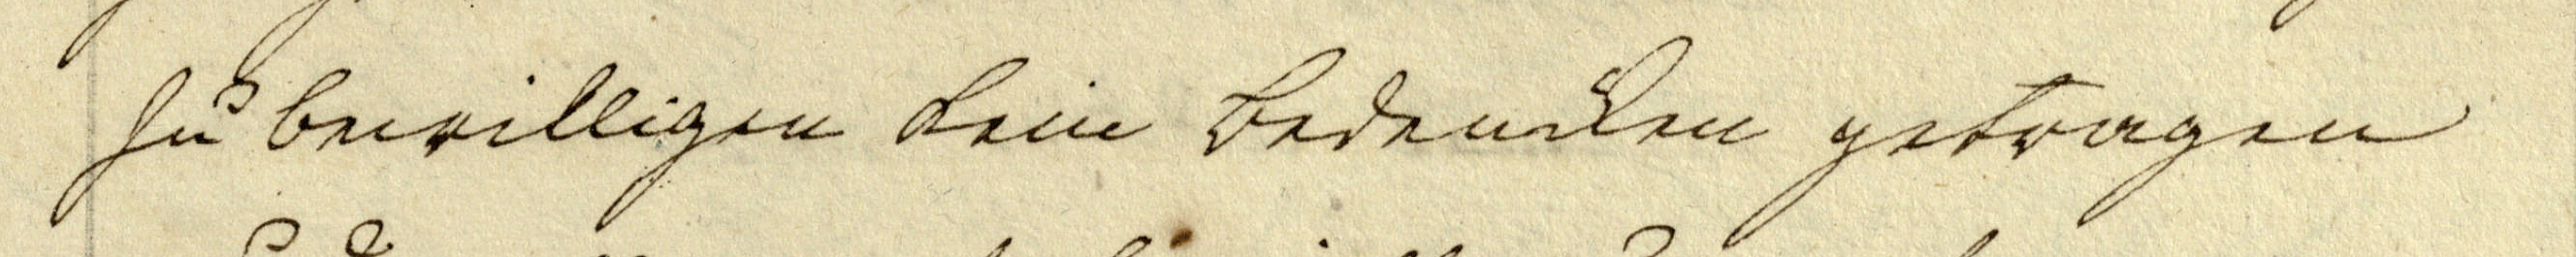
zu bewilligen kein Bedencken getragen
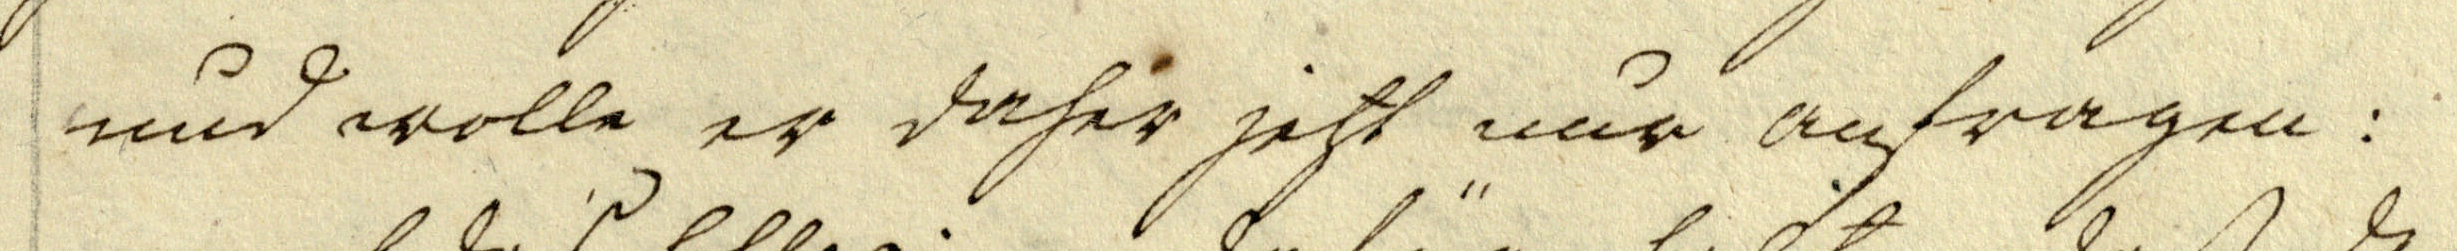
und wolle er daher jetzt nur anfragen:
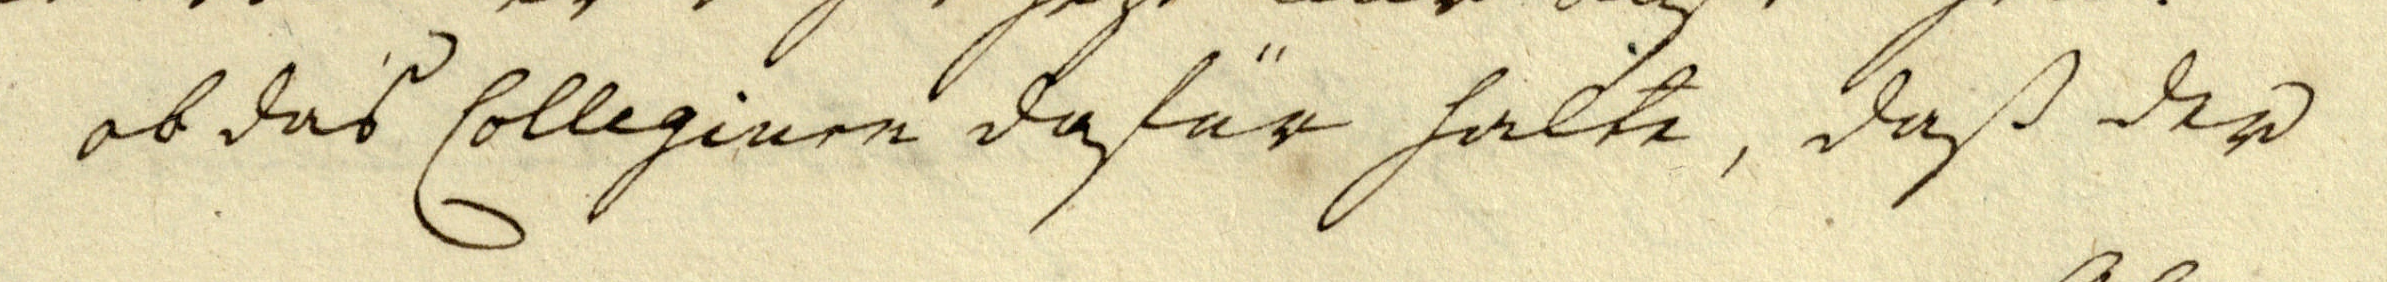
ob das Collegium dafür halte, daß der
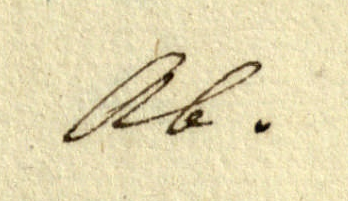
Ab
